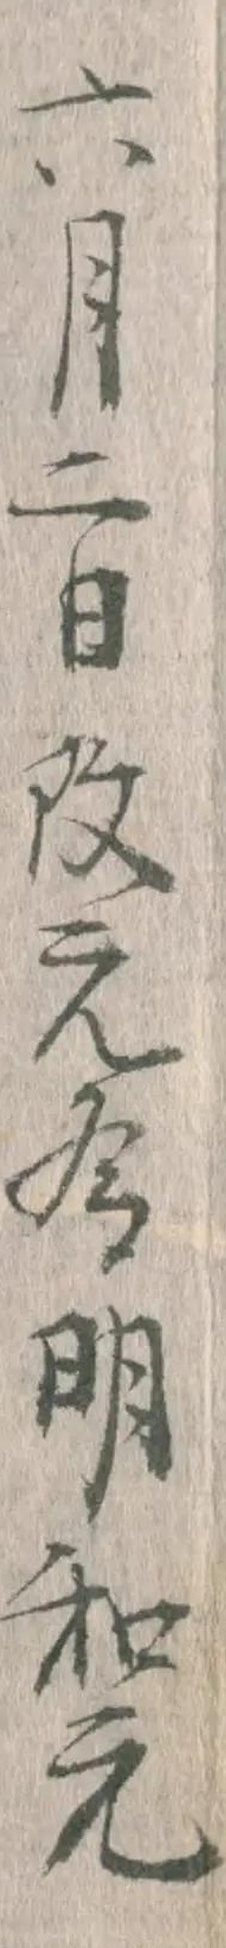六月二日改元為明和元
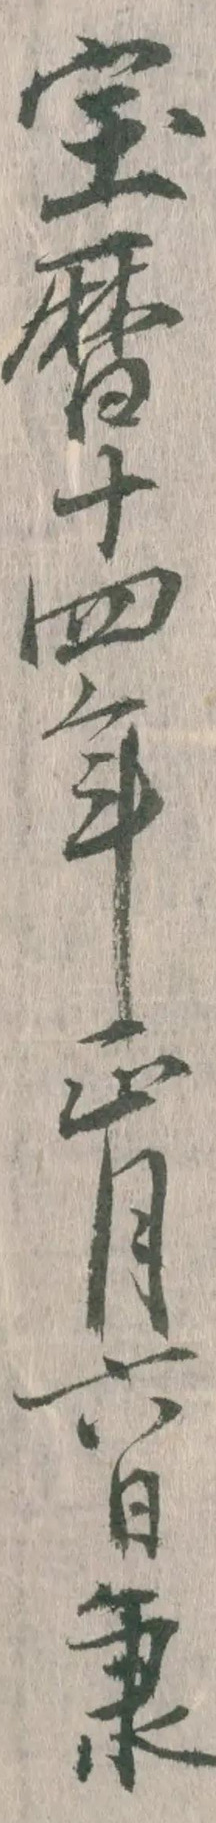宝暦十四年正月六日秉
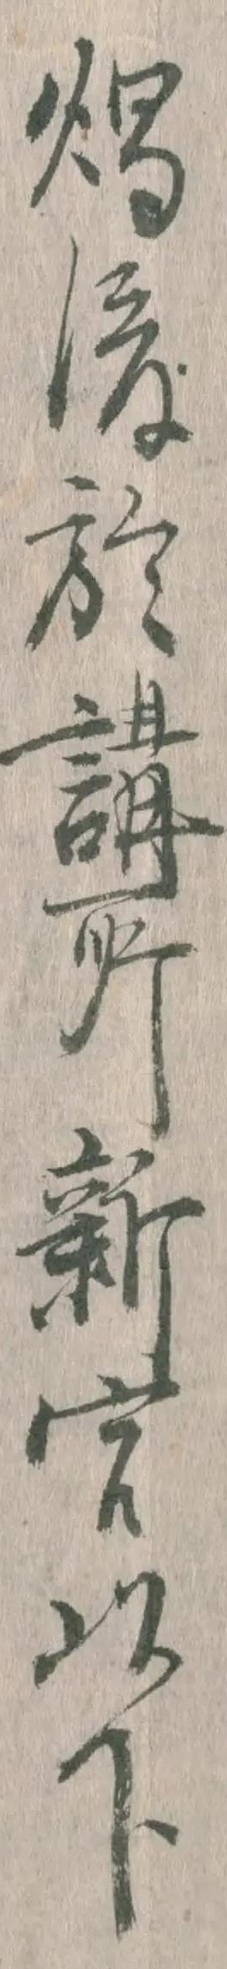燭渡於講所新宮以下
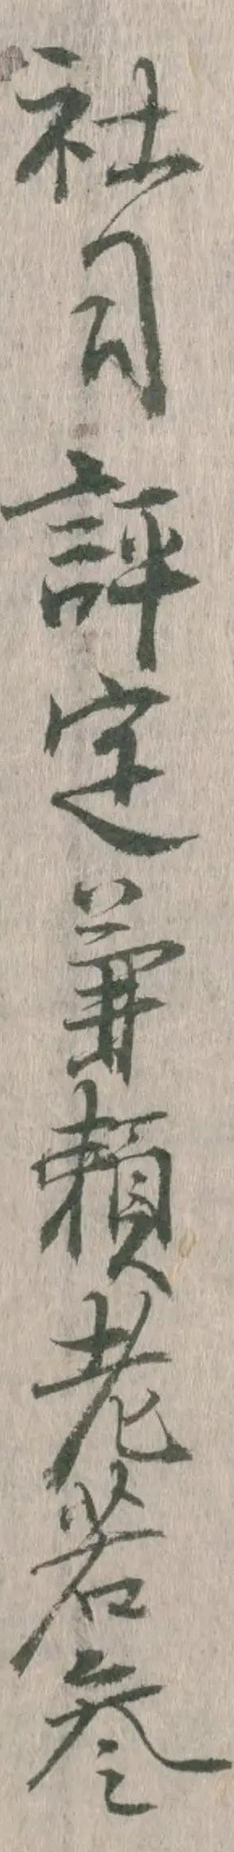社司評定兼頼老若参
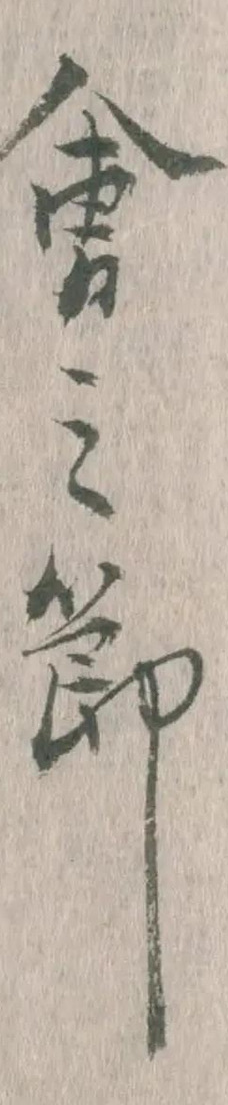會之節
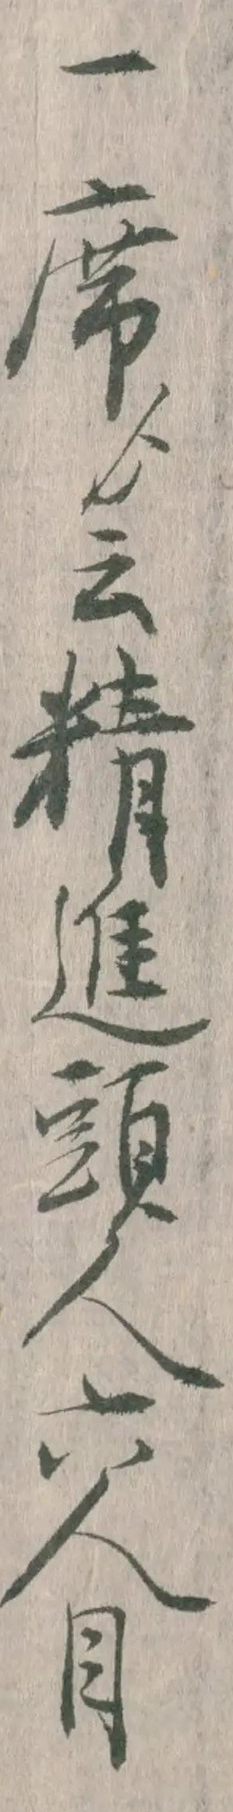一席ゟ云精進頭人六人目
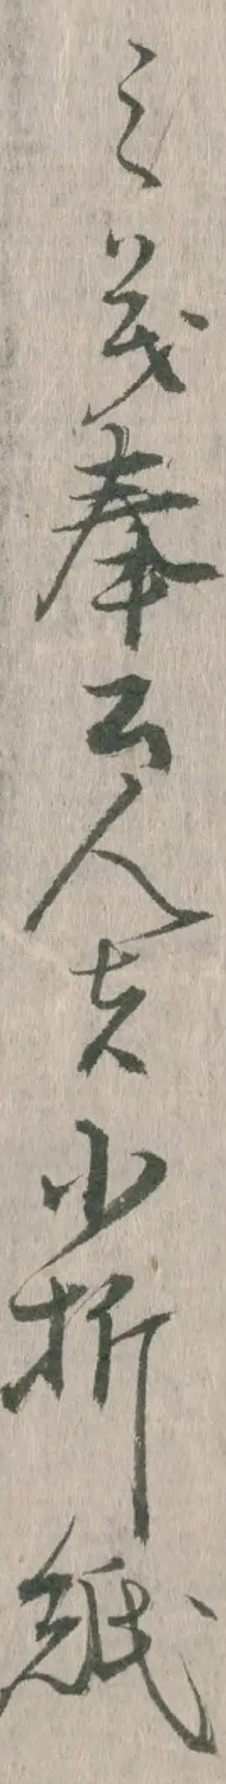之義奉公人は小折紙
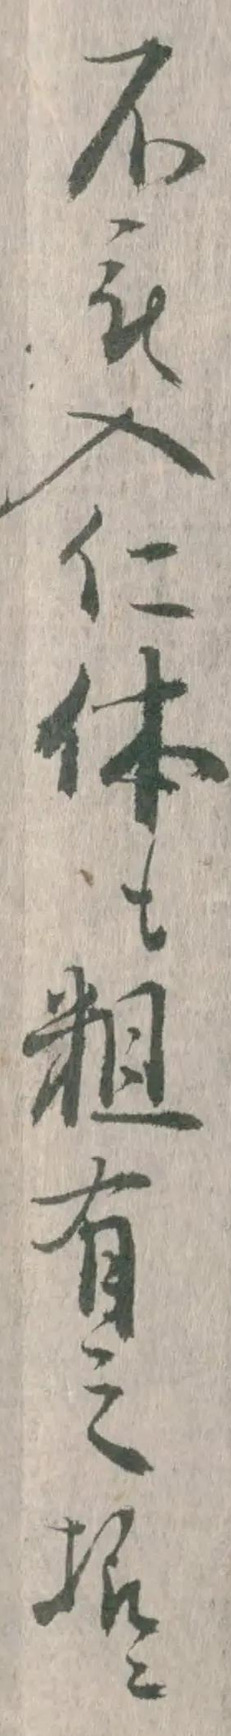不被入仁体も粗有之様ニ
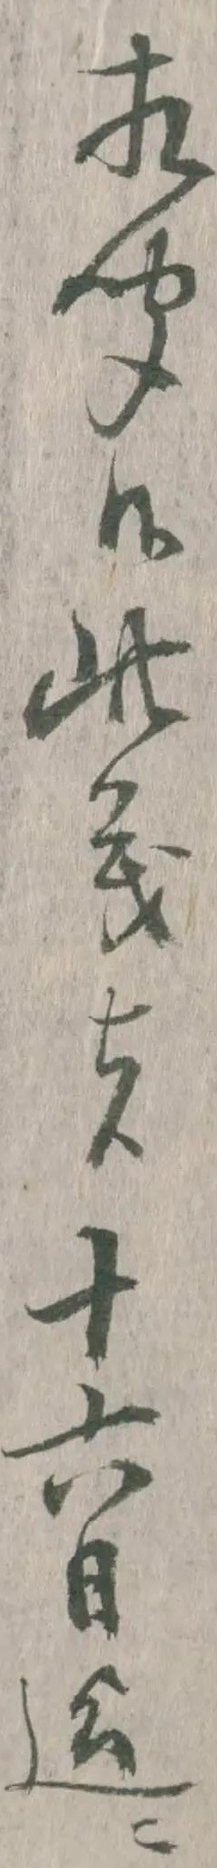相聞候此義は十六日迄ニ
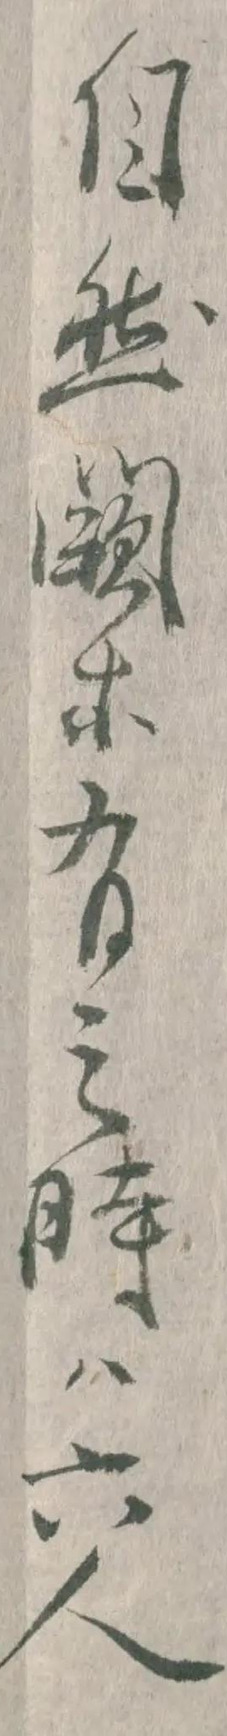自然闕等有之時は六人
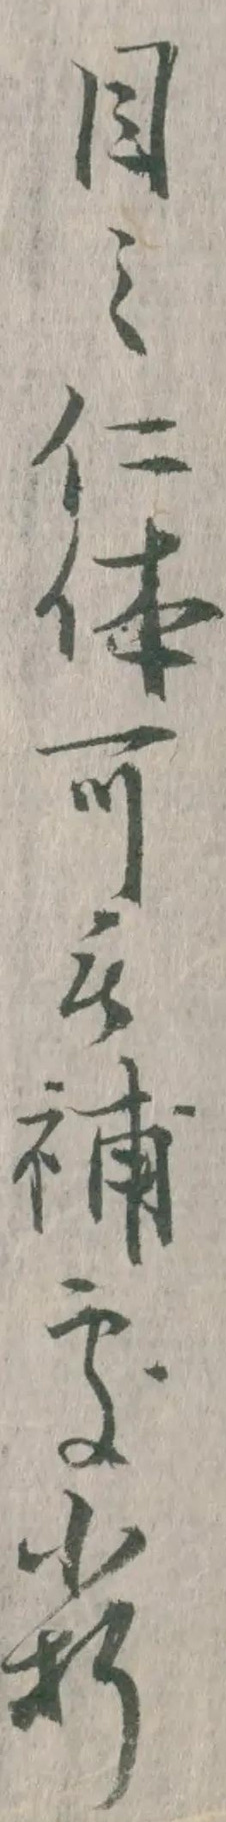目之仁体可被補處小折
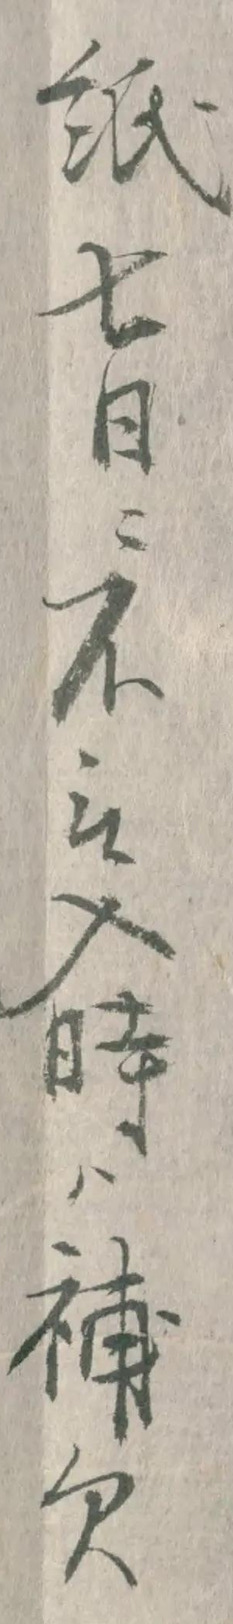紙七日ニ不被入時ハ補欠
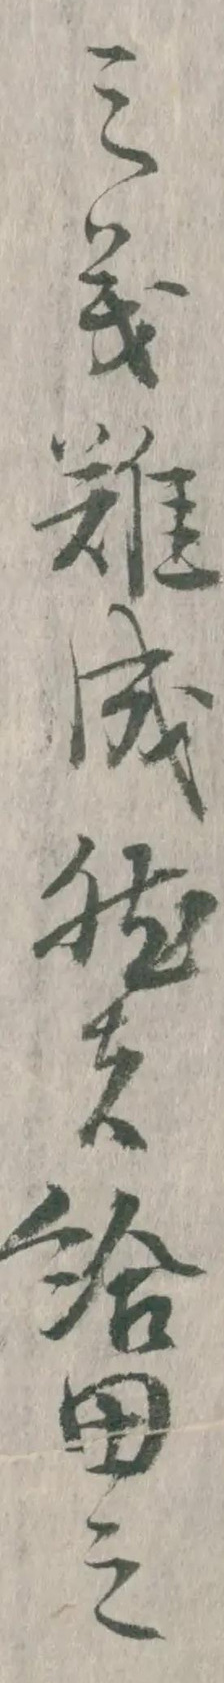之義難成然は給田之
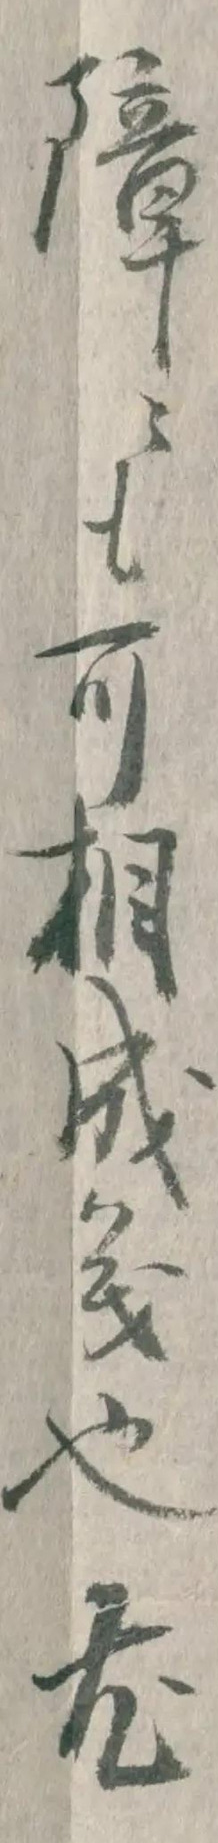障ニも可相成義也尤

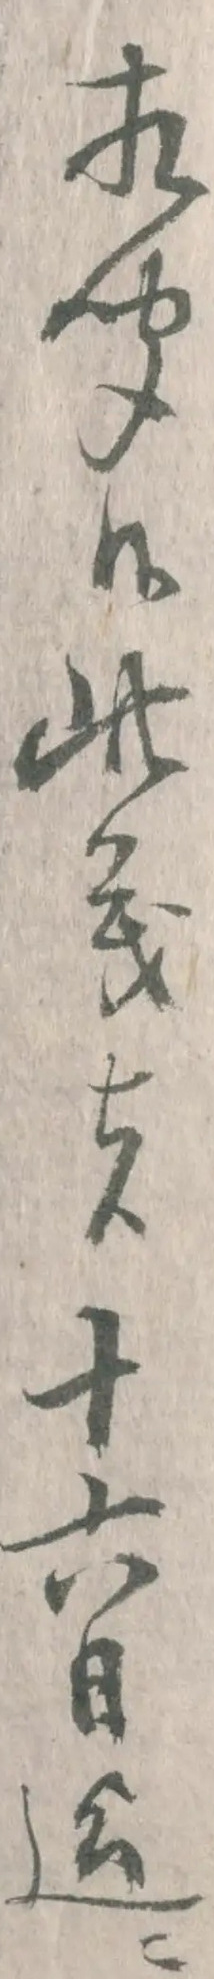相聞候此義は十六日迄ニ
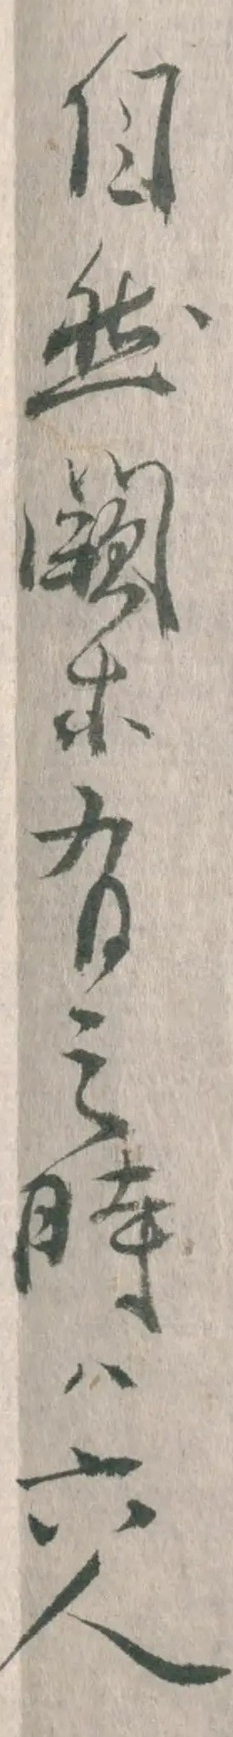自然闕等有之時は六人
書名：賀茂社記録. 第72冊
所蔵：国立国会図書館 National Diet Library, JAPAN
